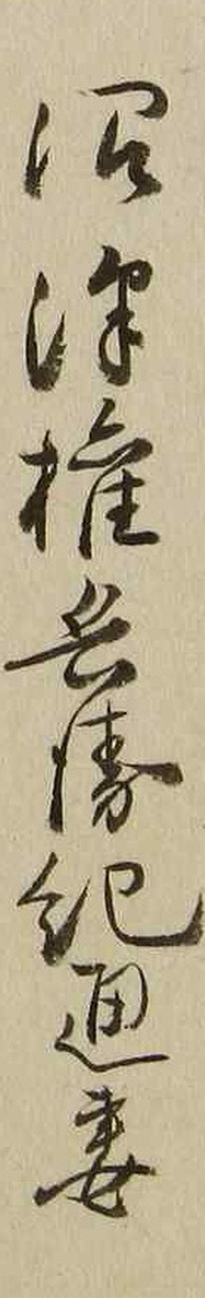女沼沢権兵衛紀通妻
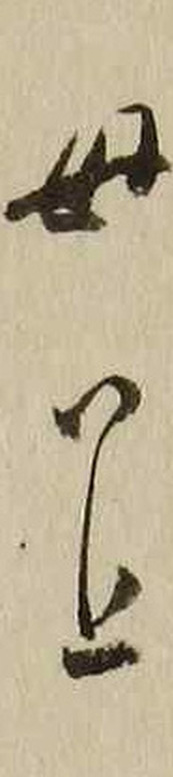母同上
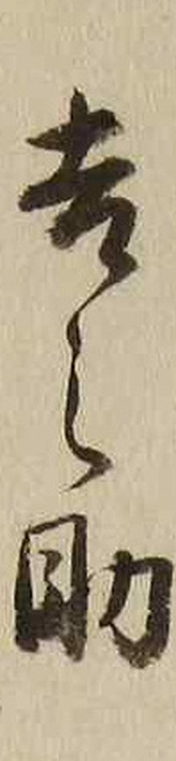吉之助
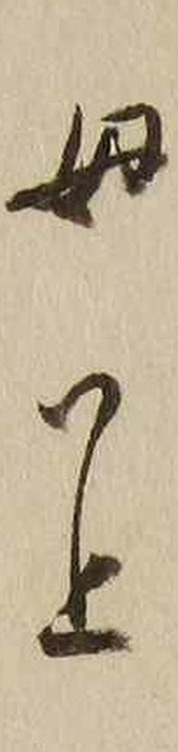母同上
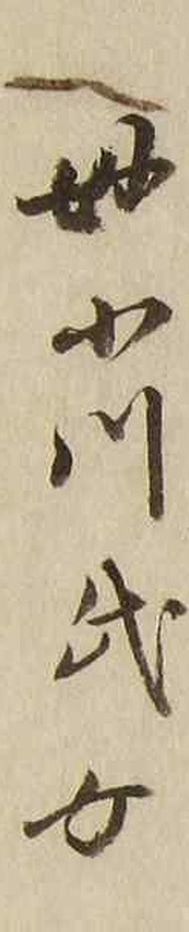母小川氏女

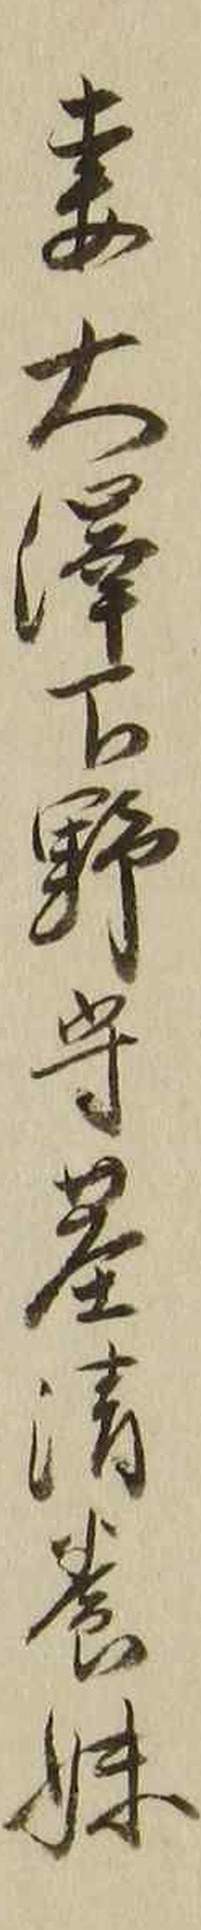妻大沢下野守基清養妹
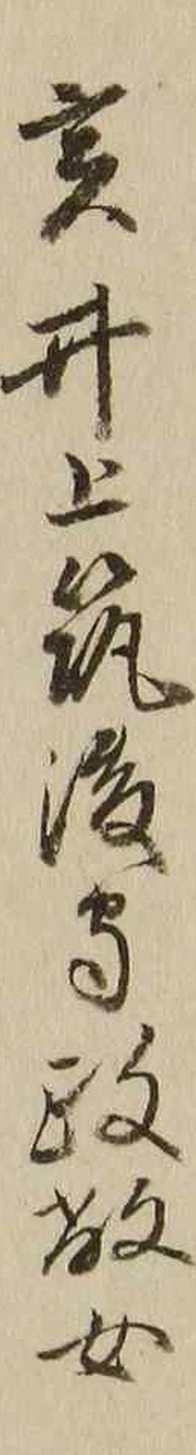実井上筑後守政蔽女
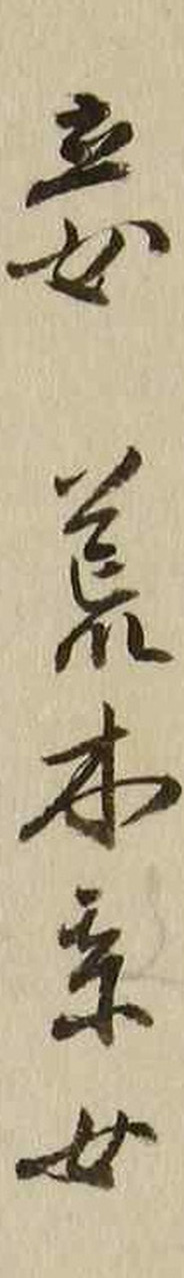妾荒木系女
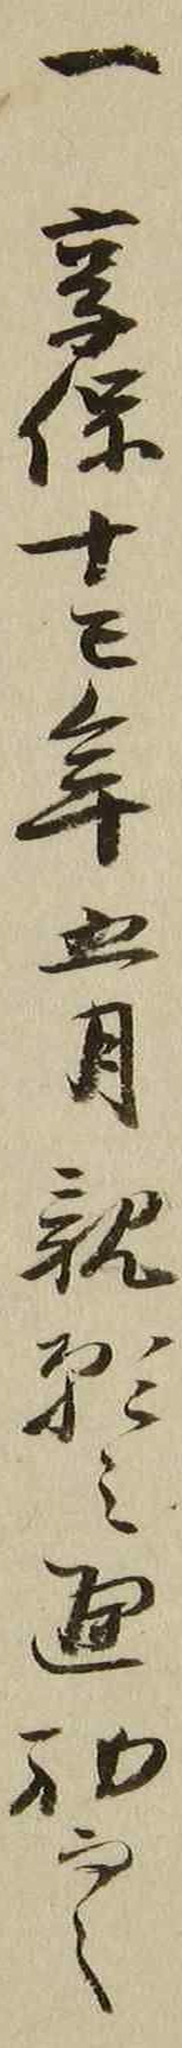一享保十巳年五月親願之通初而之
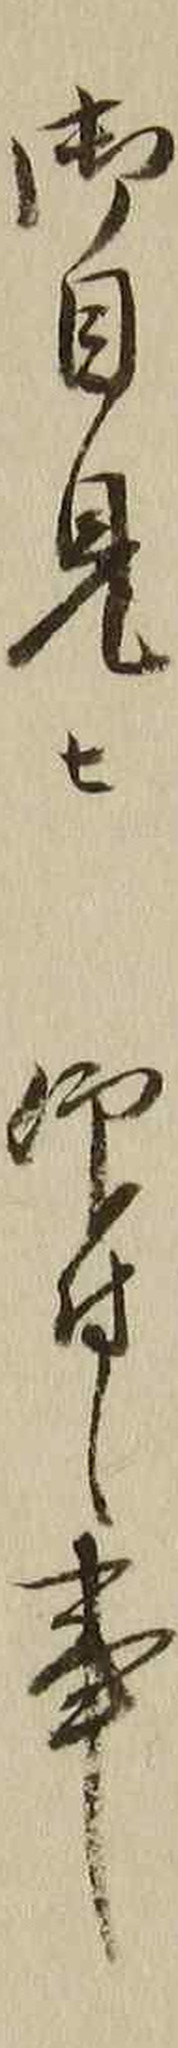御目見被仰付候事
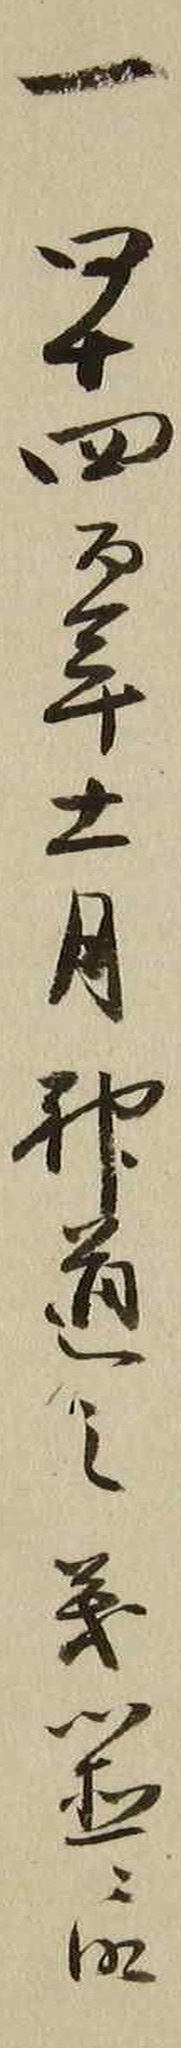一同十四酉年十一月神道之義御直々御
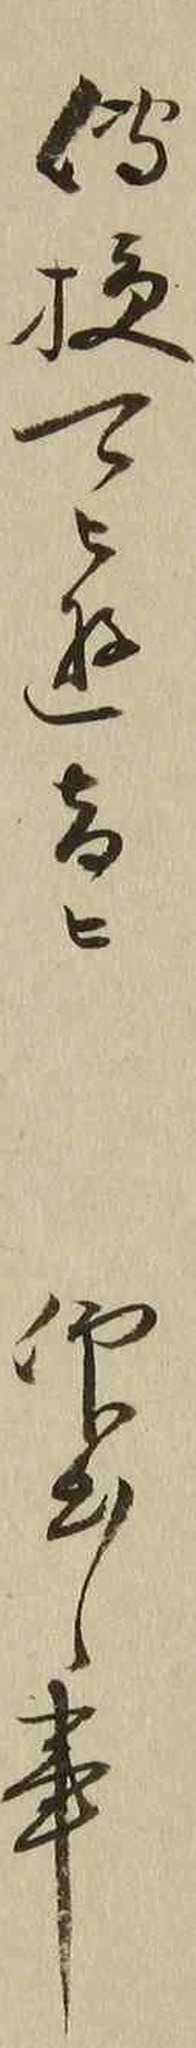伝授可被遊候旨被仰出候事
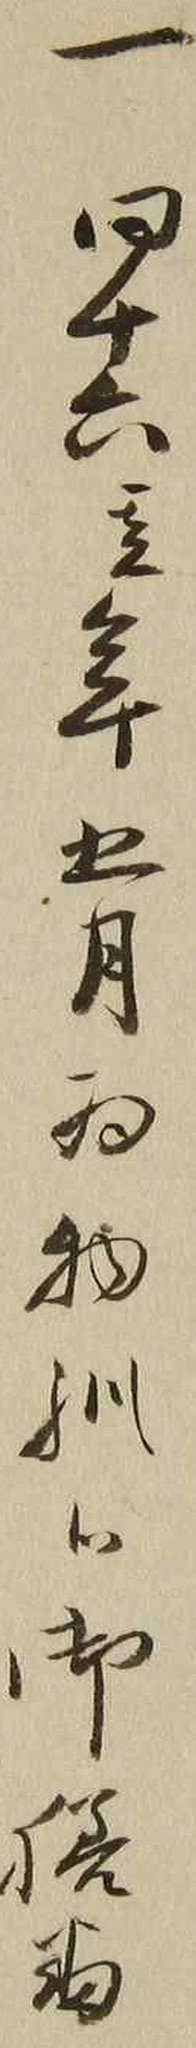一同十六亥年五月為物馴候御膳番
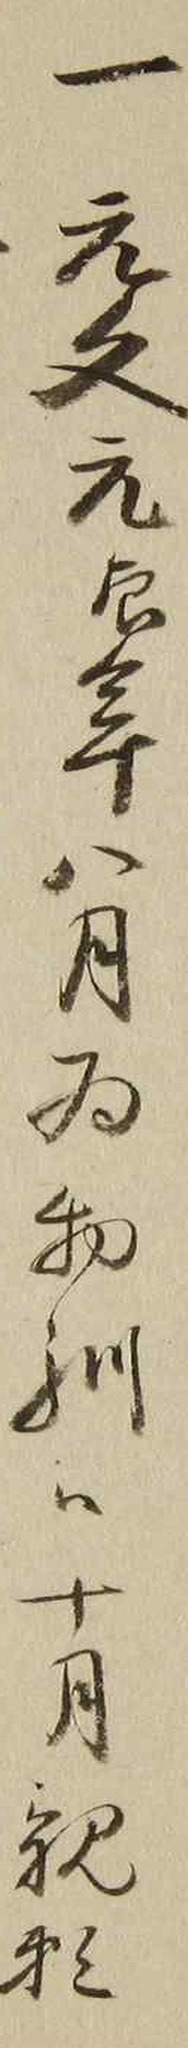一元文元辰年八月為物馴候十月親賴
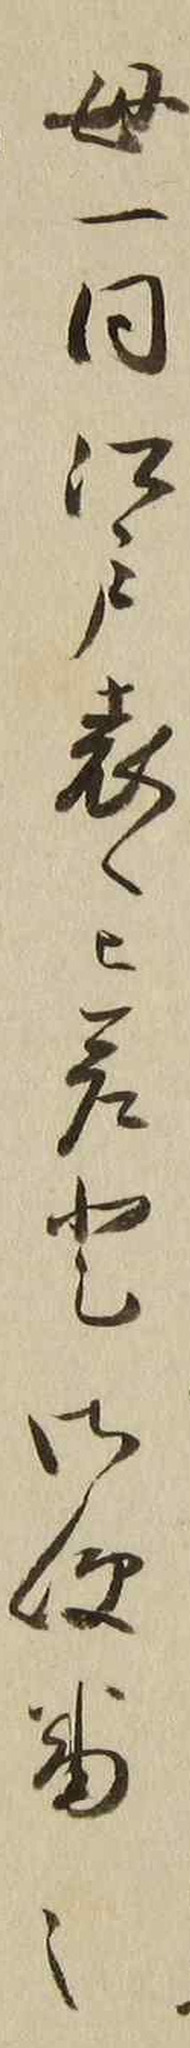母一同江戸表へ被差登御使番之
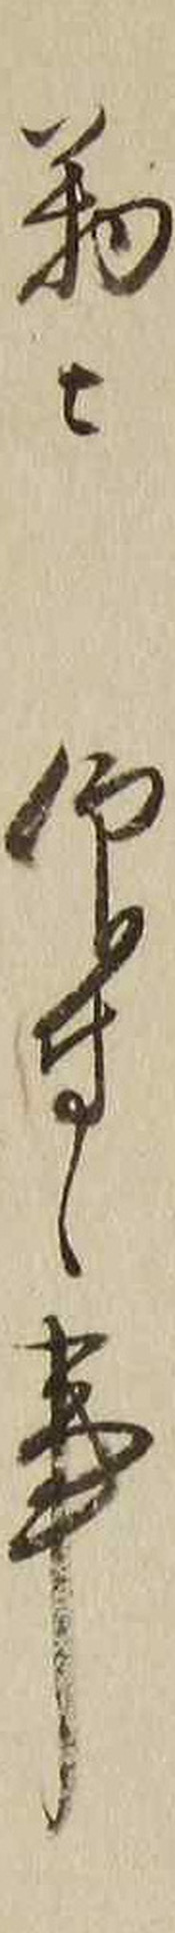勤被仰付候事
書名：諸士系譜　巻之269　さ之部1
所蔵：会津若松市立会津図書館
